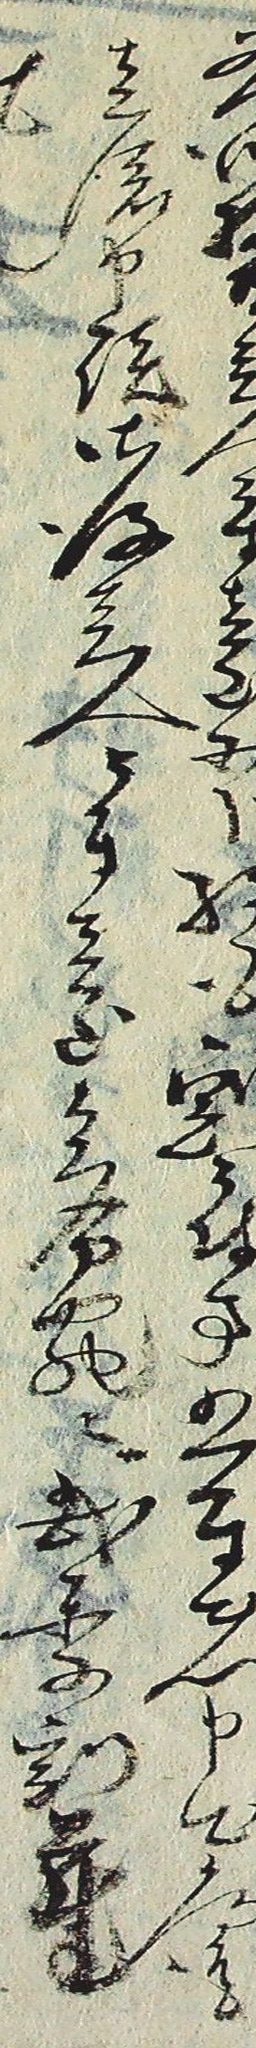壱統申談御役壱人に付壱匁壱分宛に当季割賦
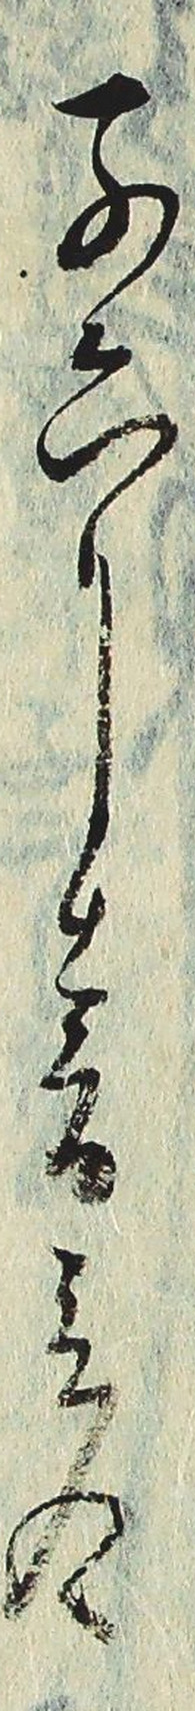子六月十三日会合

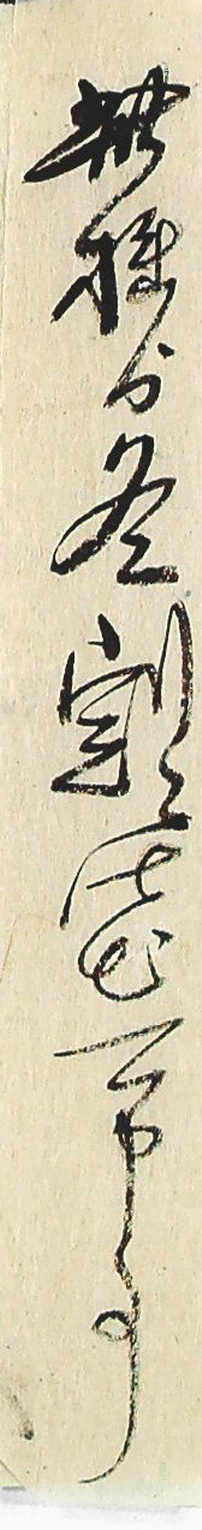覚此株ゟ冬割に仕出可申事
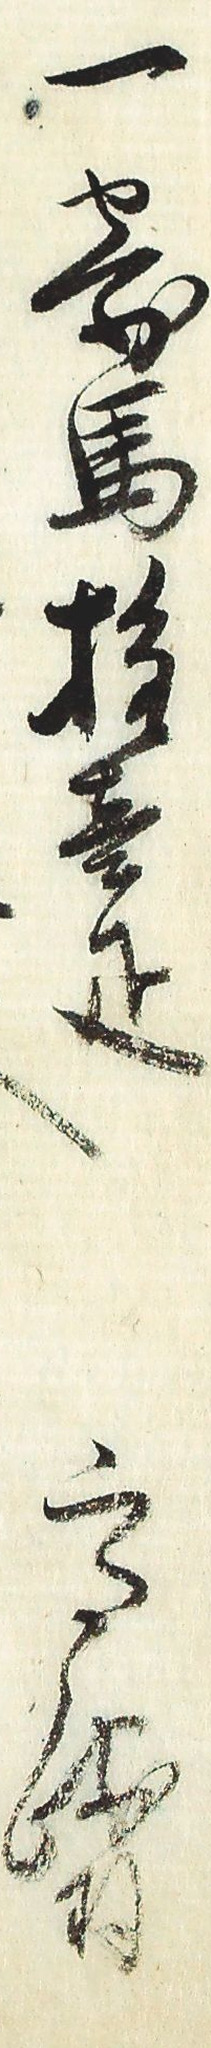一寄馬拾壱疋高崎村
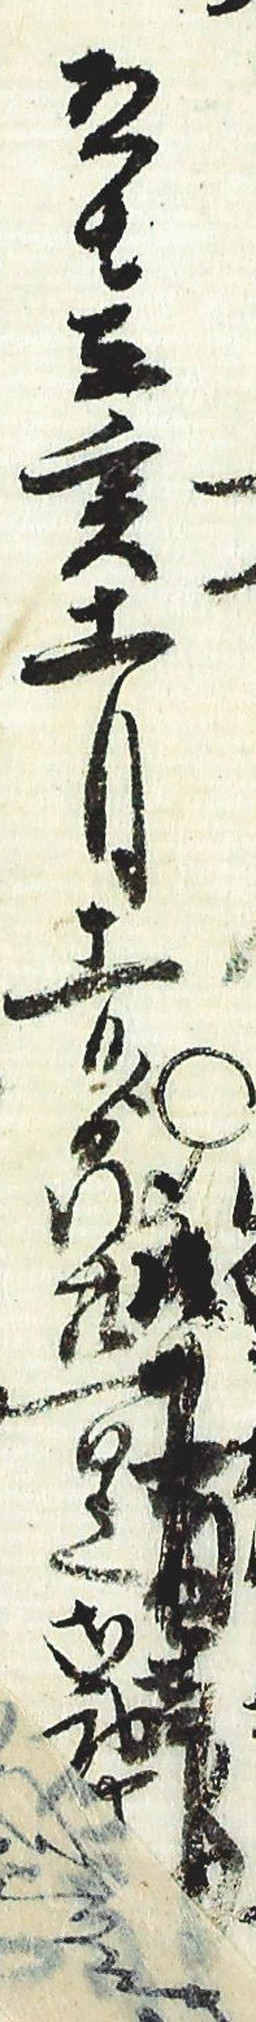右は去亥十一月十一日ゟ同廿一日迄御鷹御用
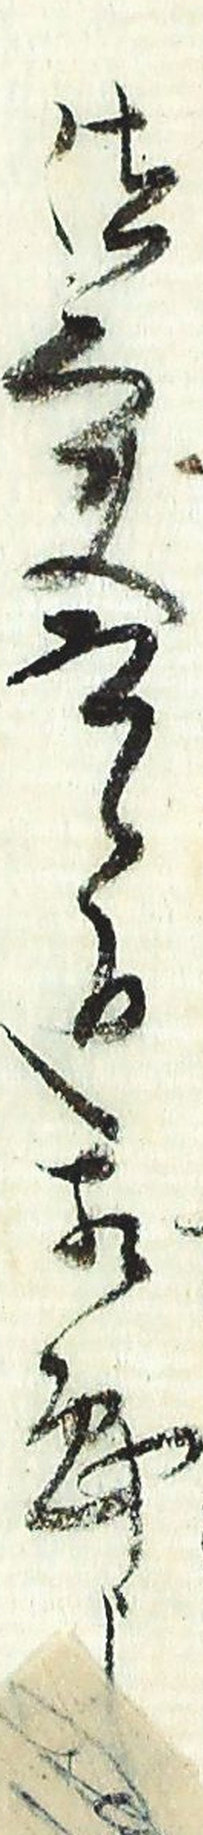詰人夫右之通相勉申候
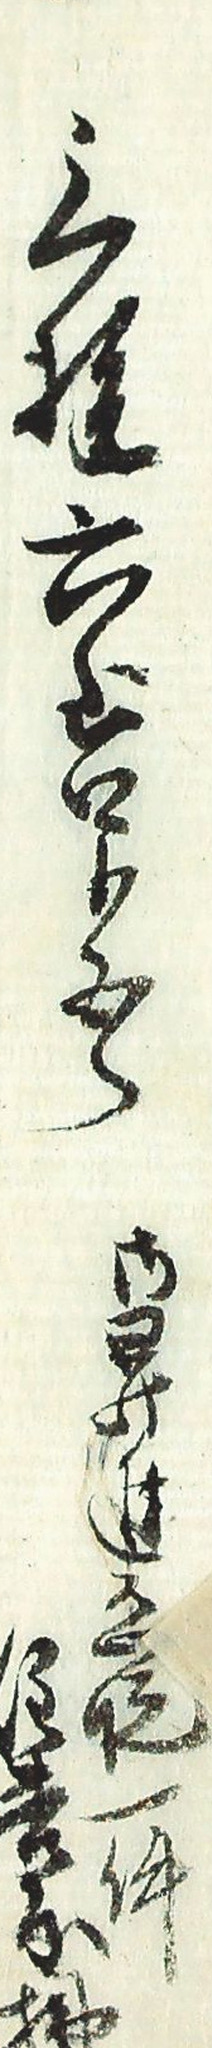一三拾六匁四分五厘御昇進恐悦一件
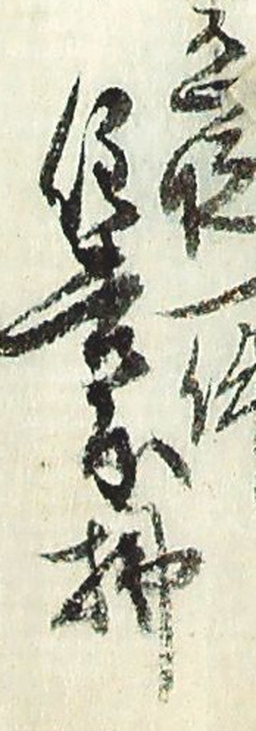住吉屋払
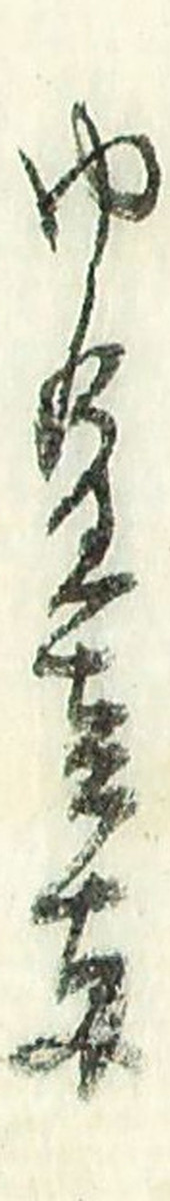内金壱両
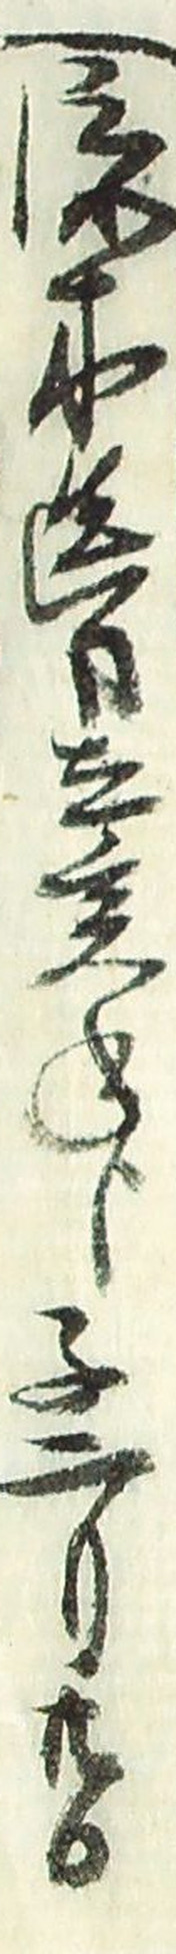流木導去亥年分子二月九日
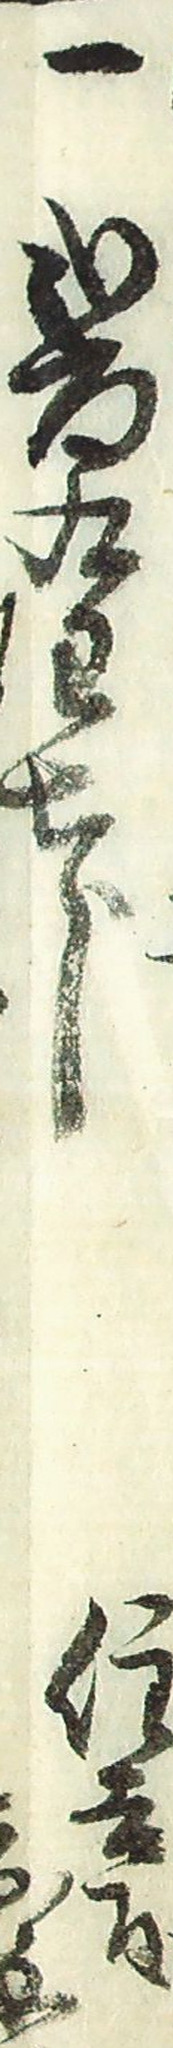一弐百九匁七分住吉屋
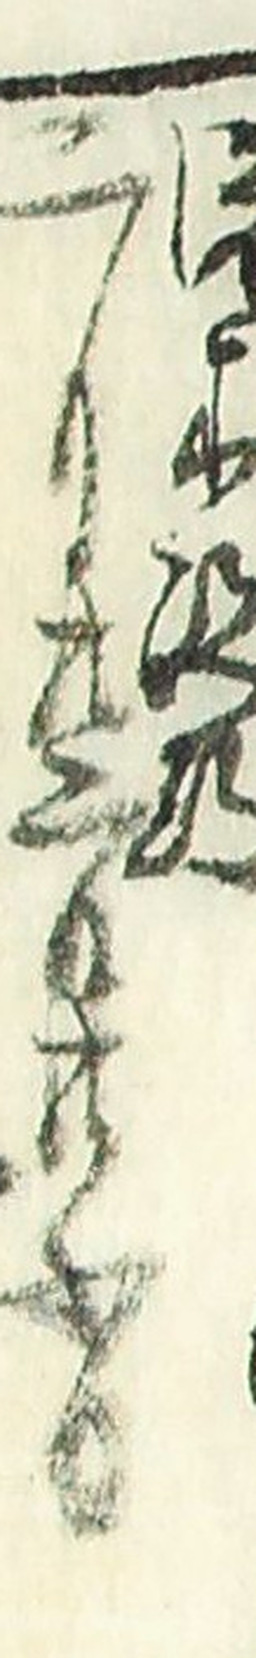二月廿二日廿五日
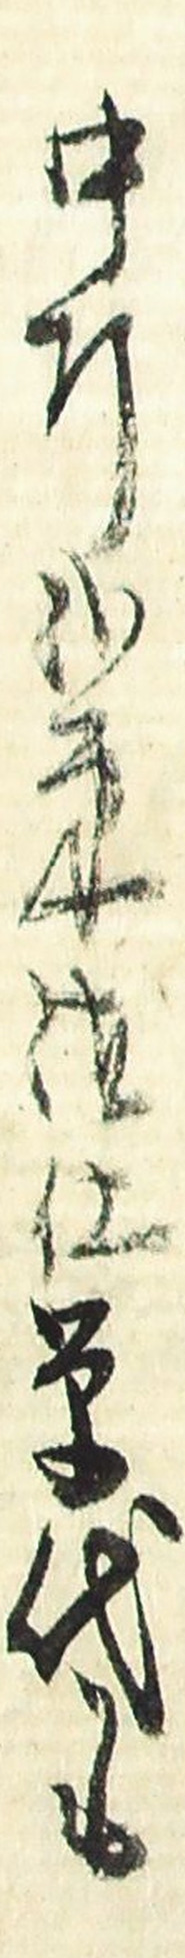中打弐束御仕筆代とも
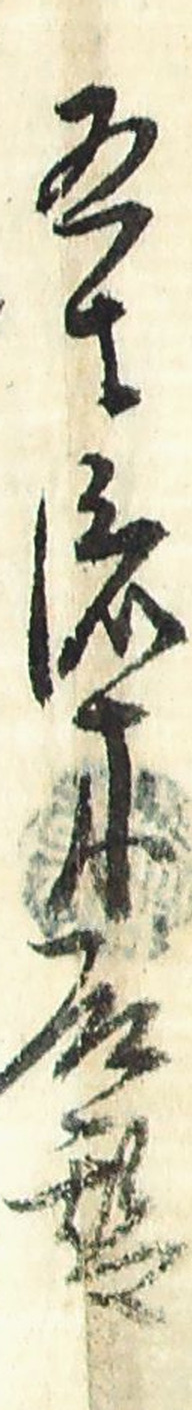右は流木取替

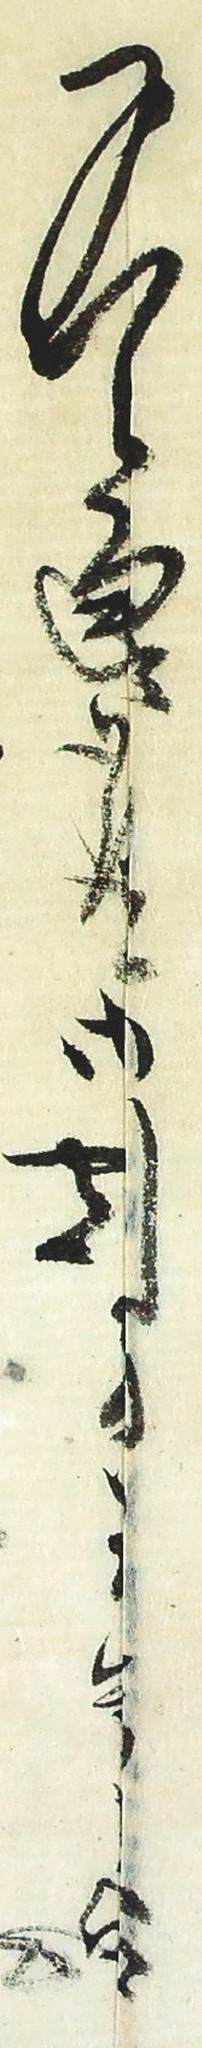右之通に御座候御割
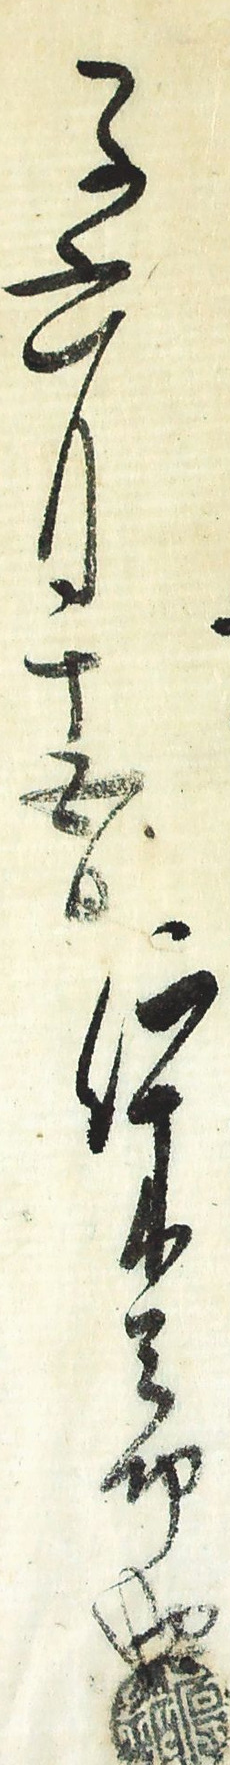子六月十五日仁木節助印
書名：名東郡中諸割賦元帳
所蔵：鳴門教育大学 Naruto University of Education
